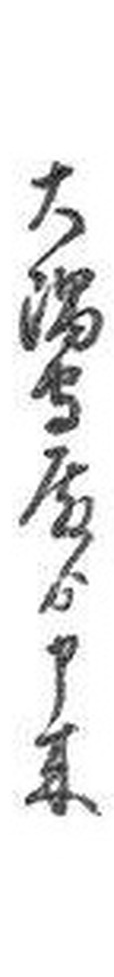大隅守殿ゟ申来
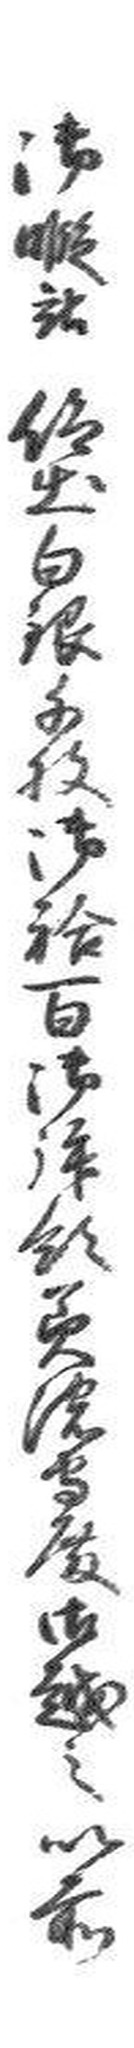御暇被仰出白銀千枚御袷百御拝領美濃守殿御越之以前
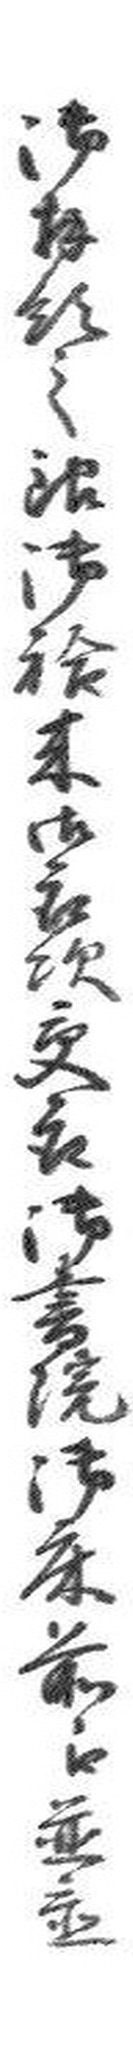御拝領之銀御袷来御取次受取御書院御床前江並置
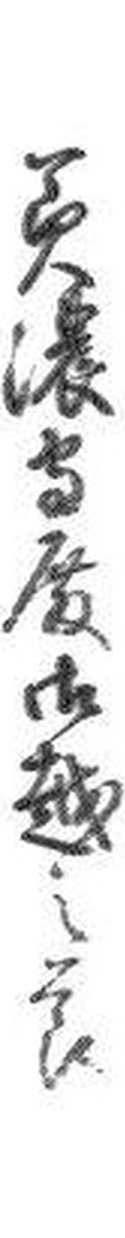美濃守殿御越之節
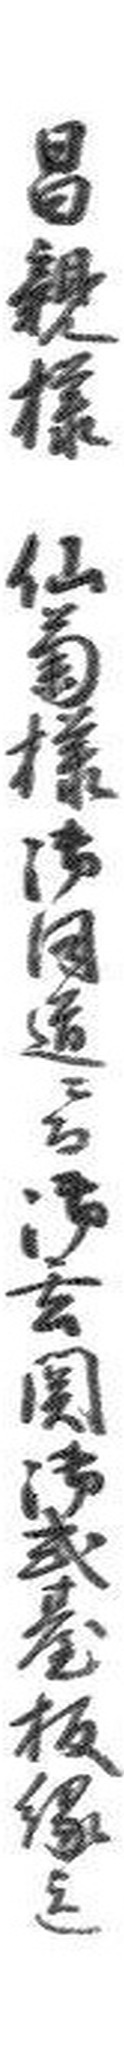昌親様仙菊様御同道ニ而御玄関御式台板縁迄
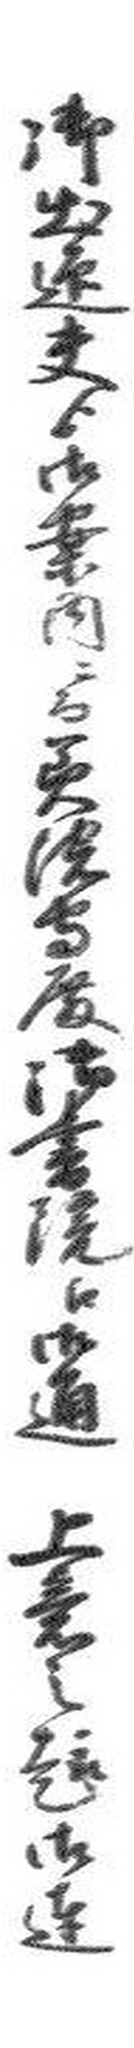御出迎夫ゟ御案内ニ而美濃守殿御書院江御通上意之趣御達
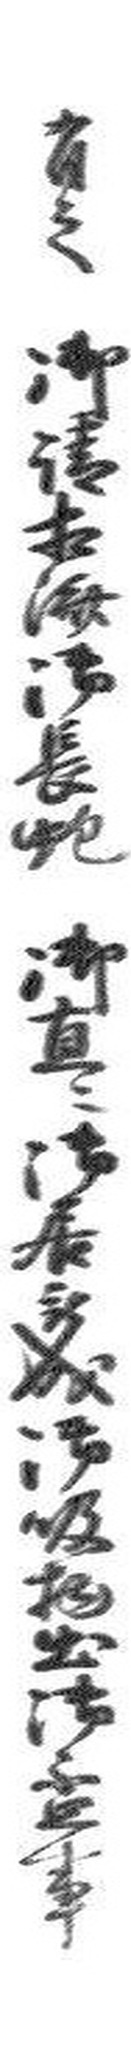有之御請相済御長蚫御直ニ御居被成御吸物出御盃事
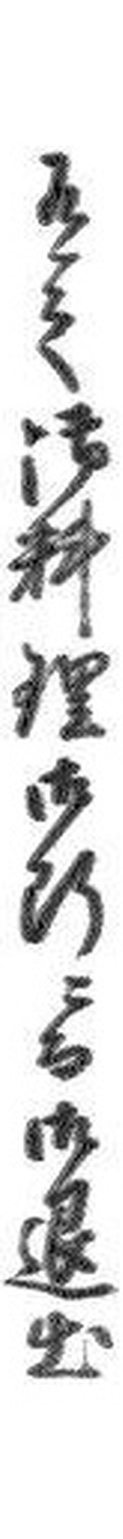有之御料理御断ニ而御退出
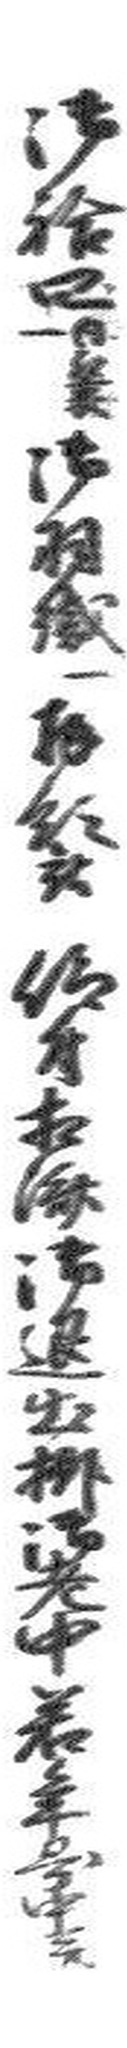御袷四内紅裏一御羽織一拝領被仰付相済御退去掛御老中若年寄中幷

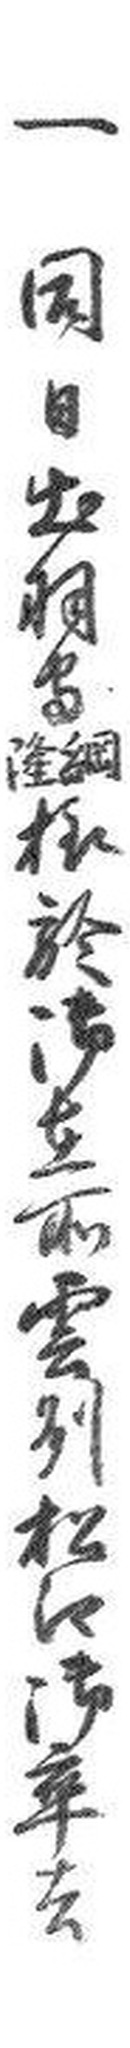一同日出羽守綱隆様於御在所雲州松江御卒去
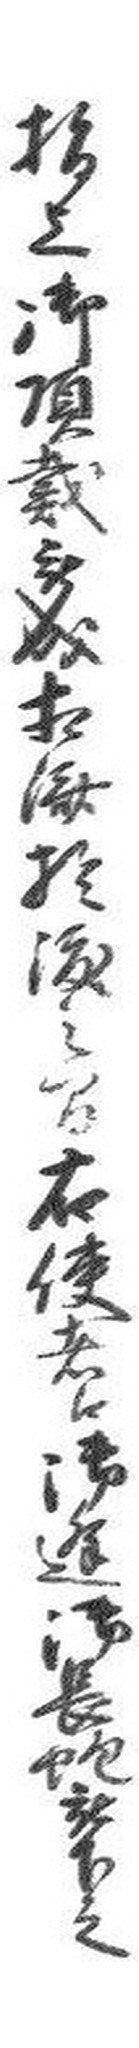指上御頂戴被成相済於渡之間右使者江御逢御長蚫被下之
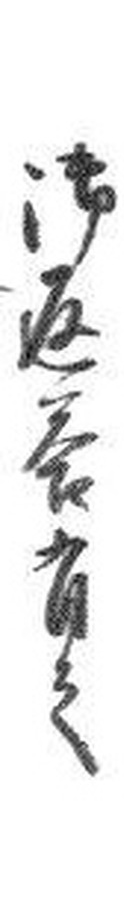御返答有之
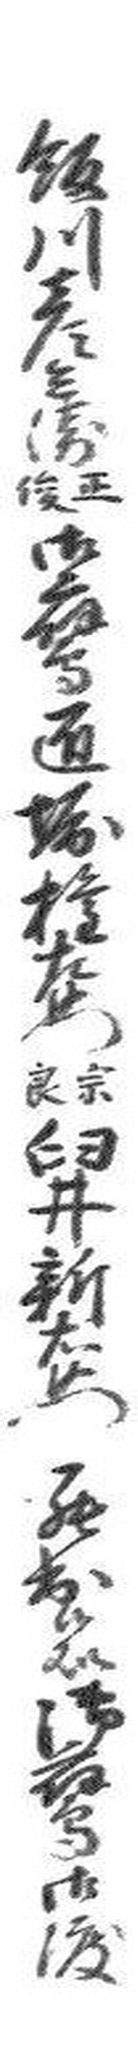飯川彦兵衛正俊御鷹匠堀権左衛門宗良臼井新右衛門罷出候処御鷹御渡
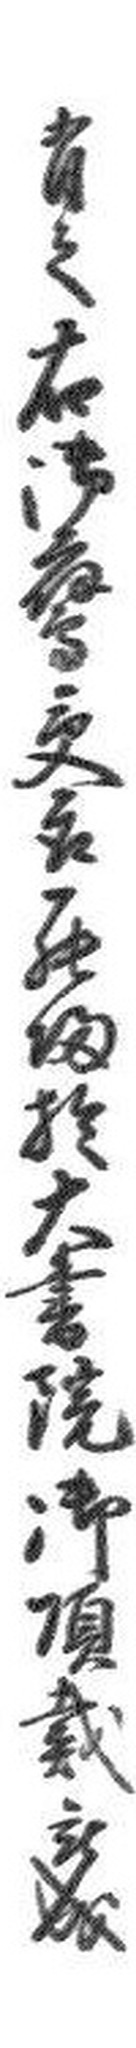有之右御鷹受取罷帰於大書院御頂戴被成
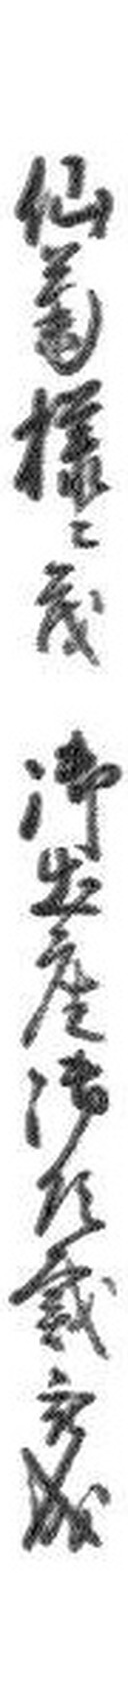仙菊様ニ茂御出座御頂戴被成
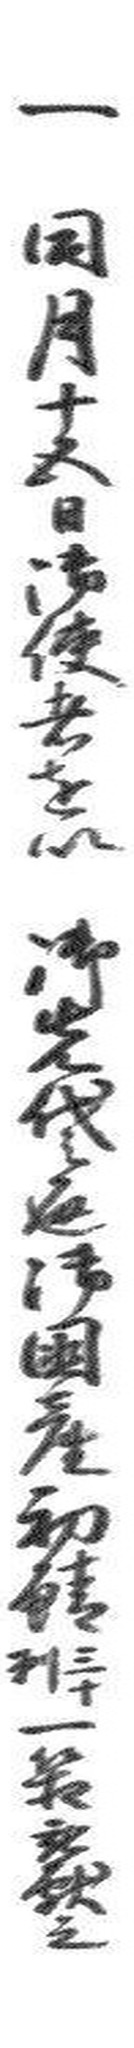一同月十五日御使者を以御先代之通御国産初鯖三十刺一箱被献之
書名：家譜 十一 昌親公 従延宝二年到延宝四年八月
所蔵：福井県文書館 Fukui Prefectural Archives
